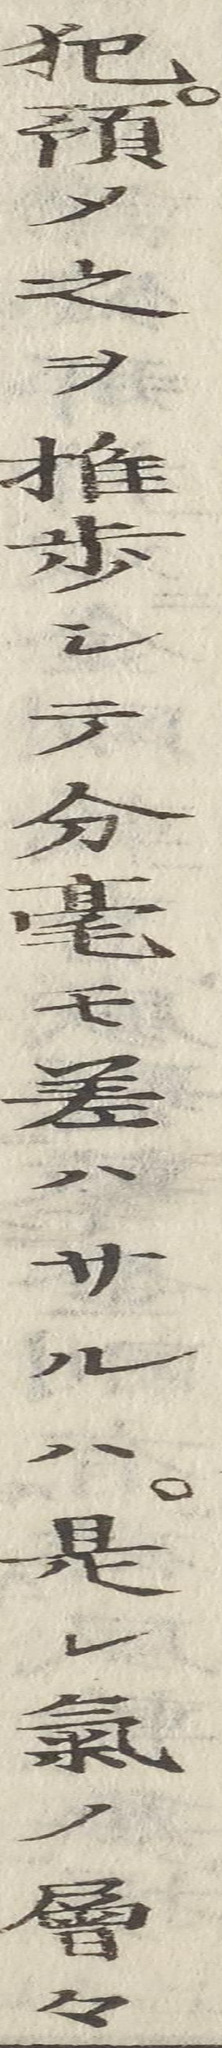犯。預メ之ヲ推歩シテ分毫モ差ハサルハ。是レ気ノ層々
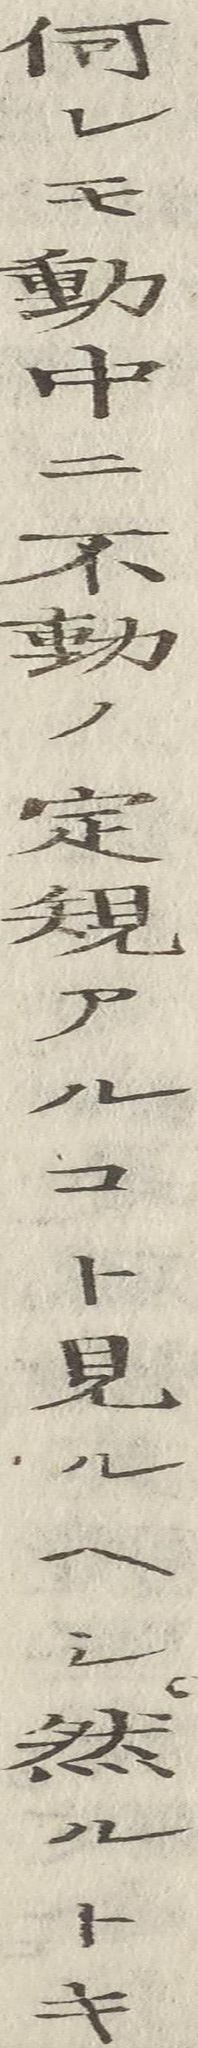何レモ動中ニ不動ノ定規アルコト見ルヘシ。然ルトキ
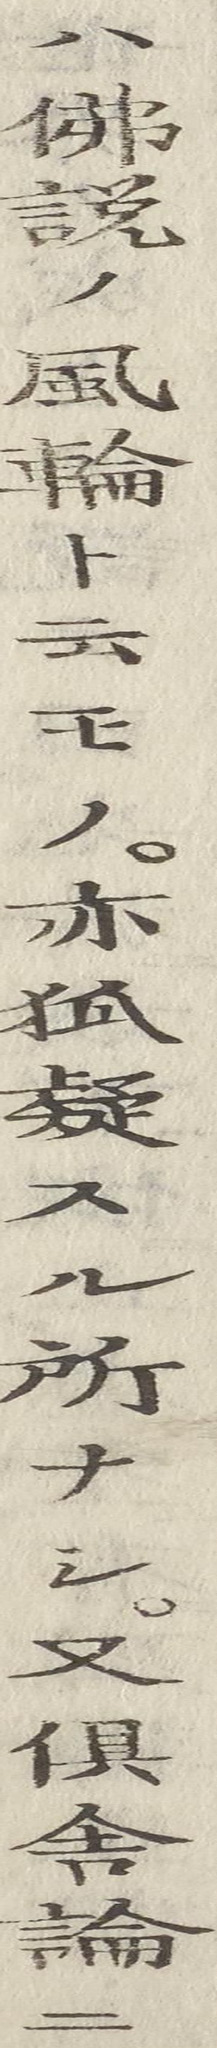ハ仏説ノ風輪ト云モノ。亦狐疑スル所ナシ。又俱舎論ニ

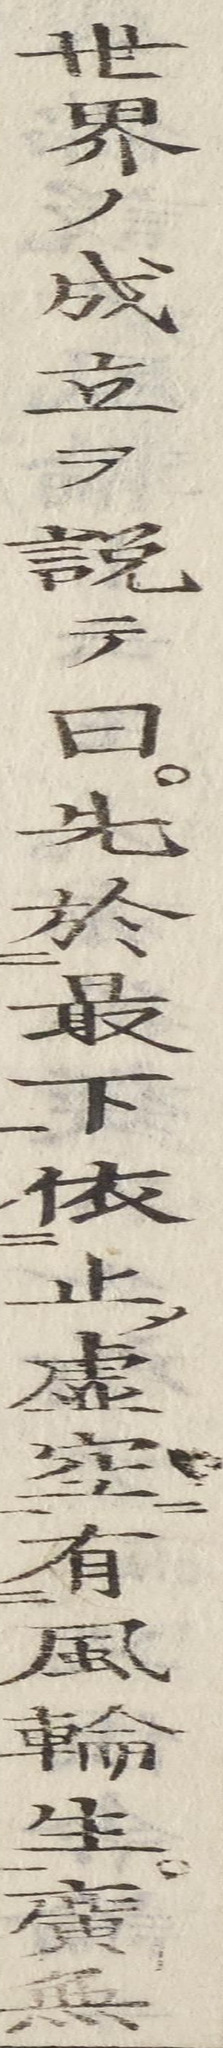世界ノ成立ヲ説テ曰。先於ニ最下依ニ止虚空有ニ風輪生。広無
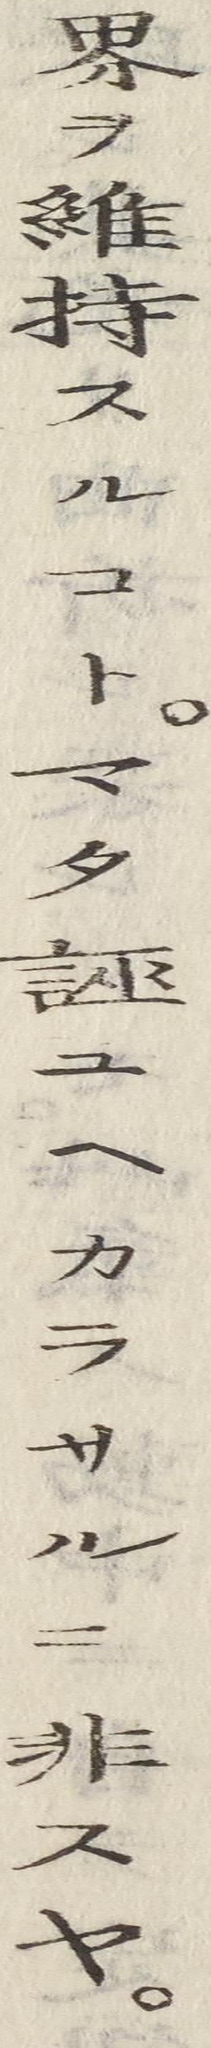界ヲ維持スルコト。マタ誣ユヘカラサルニ非スヤ。
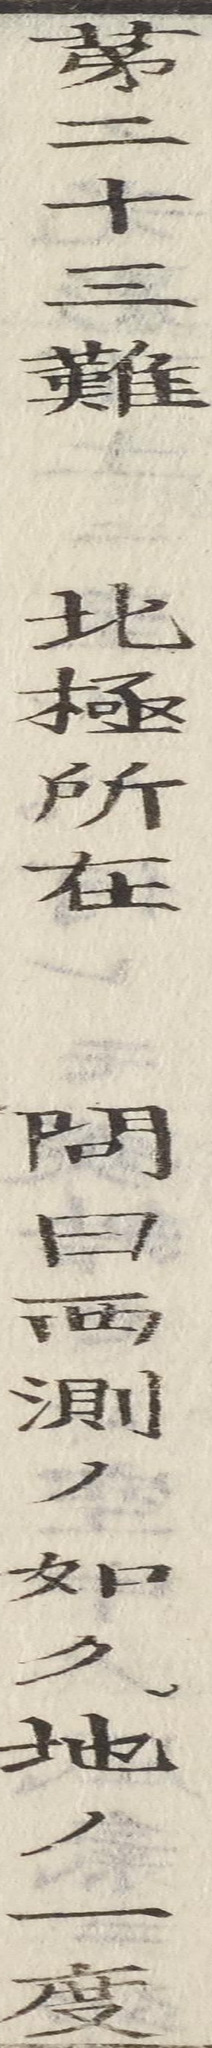第二十三難北極所在問曰西測ノ如ク地ノ一度
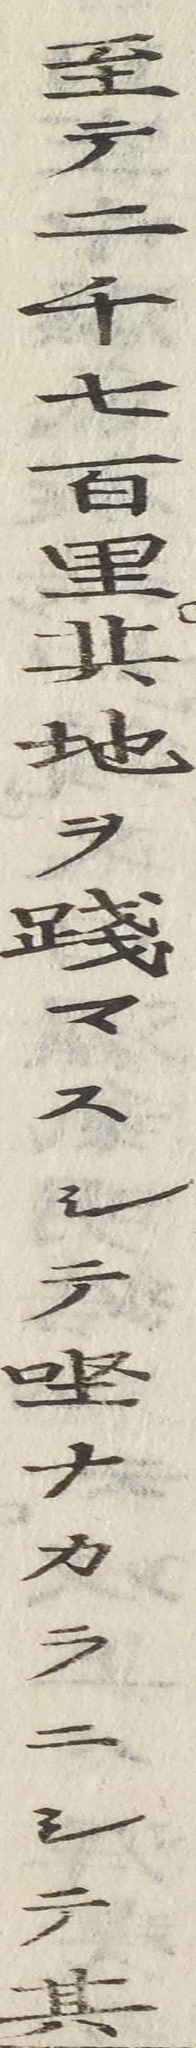至テ二千七百里。其地ヲ践マスシテ坐ナカラニシテ其
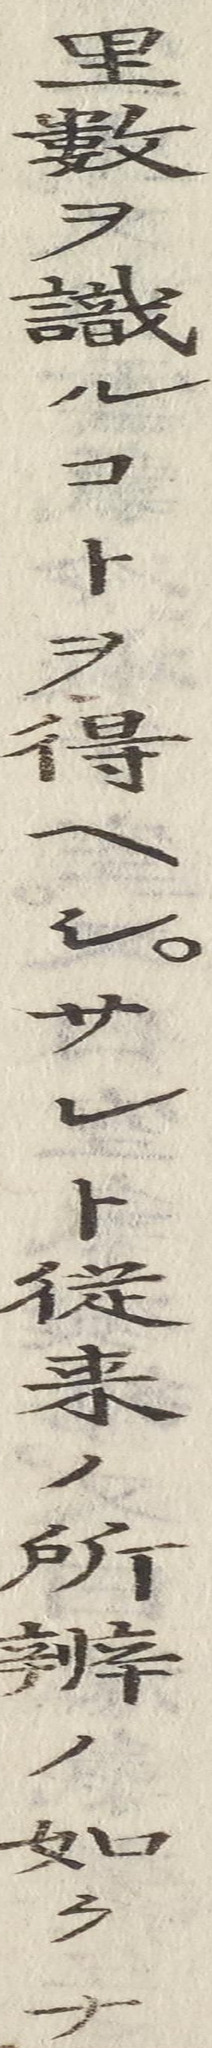里数ヲ識ルコトヲ得ヘシ。サレト従来ノ所弁ノ如クナ
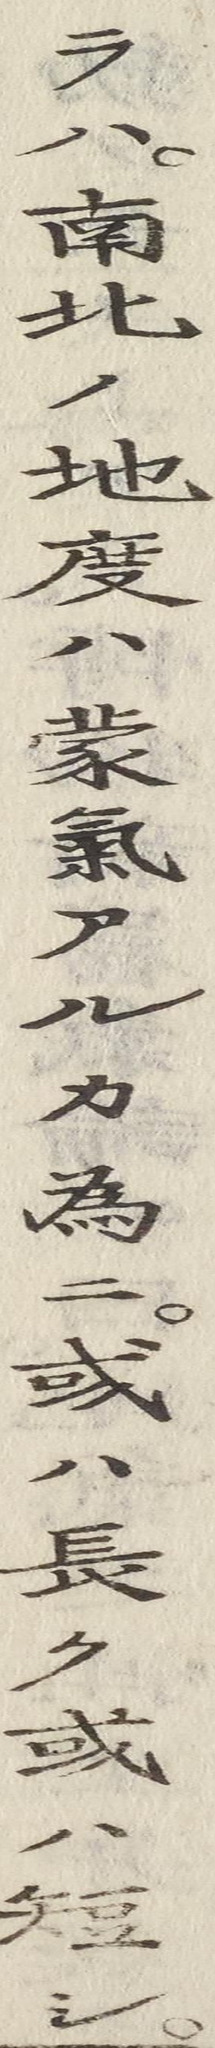ラハ。南北ノ地度ハ蒙気アルカ為ニ。或ハ長ク或ハ短シ。
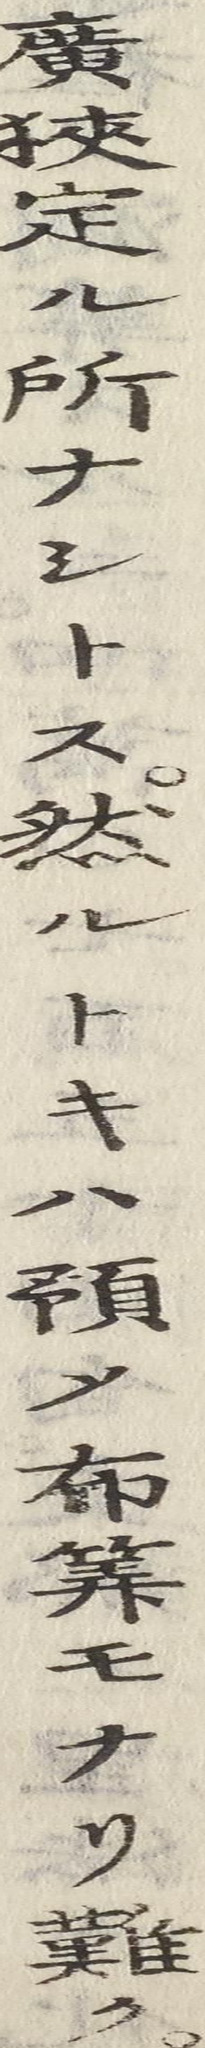広狭定ル所ナシトス。然ルトキハ預メ布筭モナリ難ク。
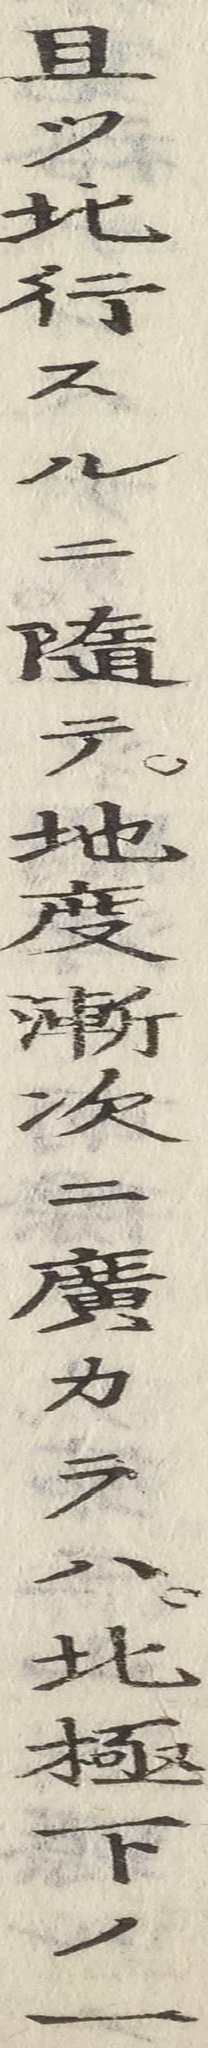且ツ北行スルニ随テ。地度漸次ニ広カラハ。北極下ノ一
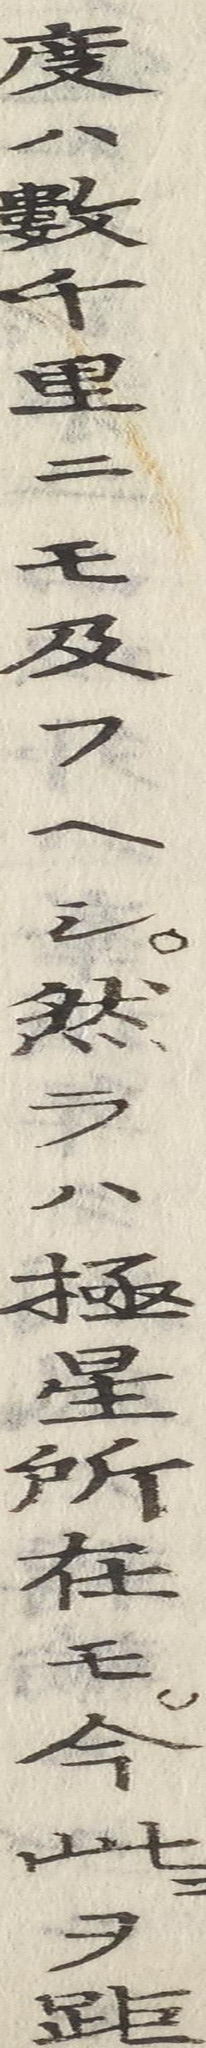度ハ数千里ニモ及フヘシ。然ラハ極星所在モ。今此距
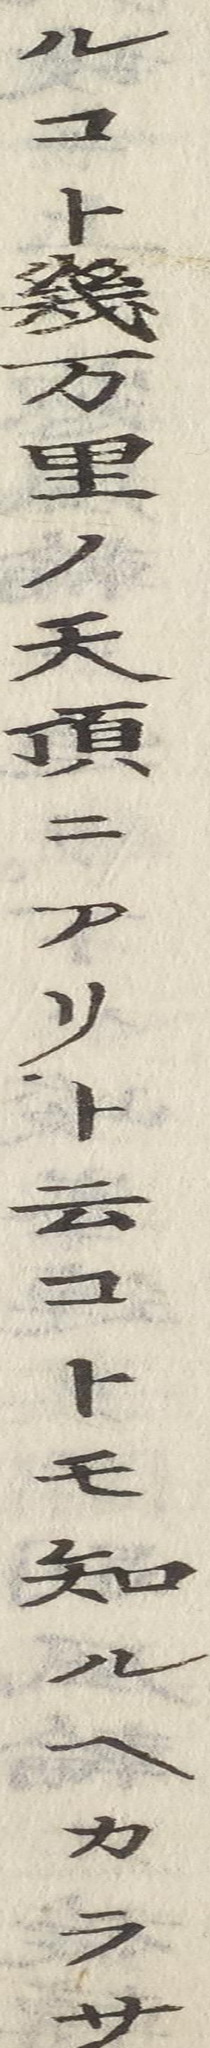ルコト幾万里ノ天頂ニアリト云コトモ知ルヘカラサ
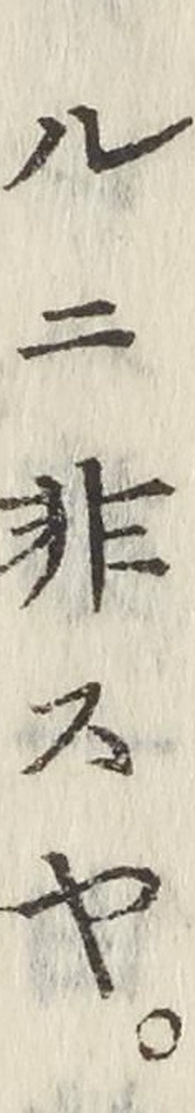ルニ非スヤ。
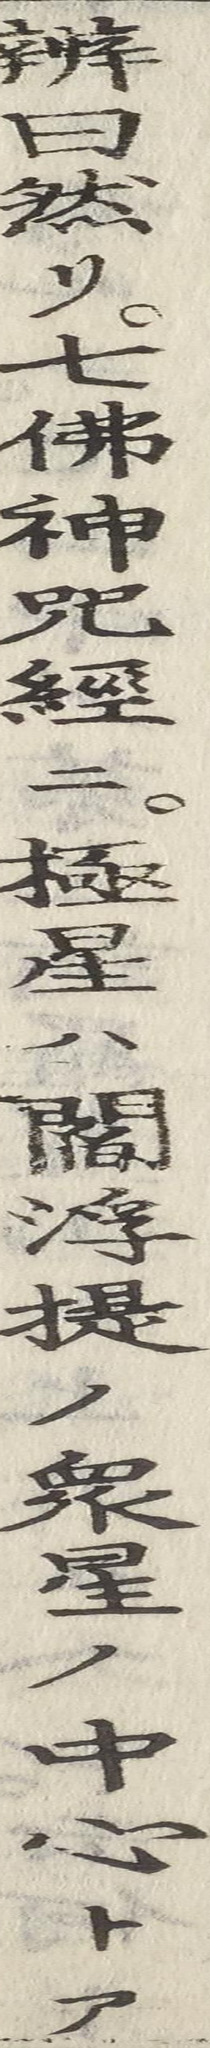弁曰然リ。七仏神呪経ニ。極星ハ閻浮提ノ衆星ノ中心トア
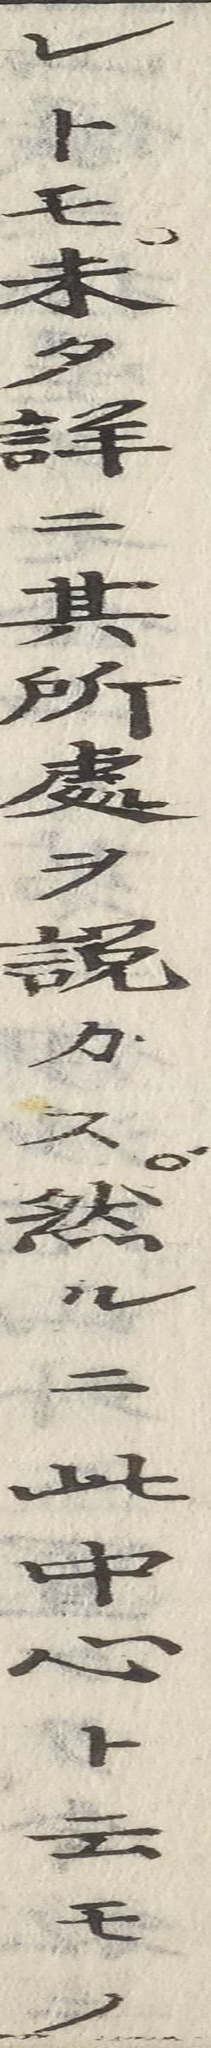レトモ。未タ詳ニ其所処ヲ説カス。然ルニ此中心ト云モノ
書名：護法新論　二編　中
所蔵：東京大学地震研究所図書室 Earthquake Research Institute Library, The University of Tokyo, JAPAN
